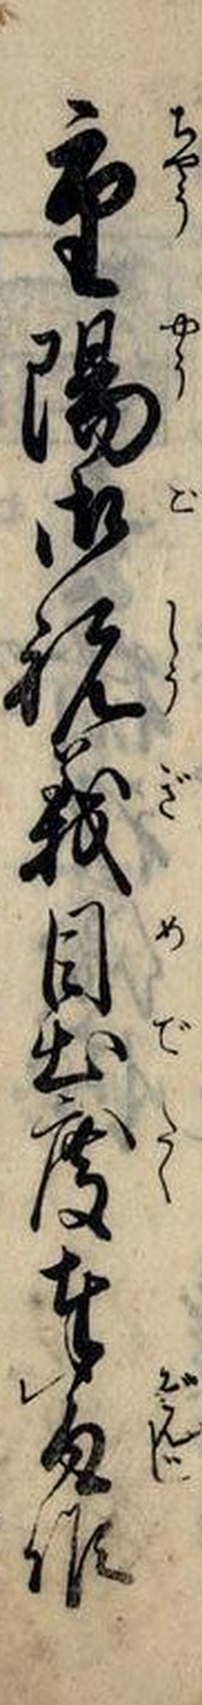重陽御祝義目出度奉存候

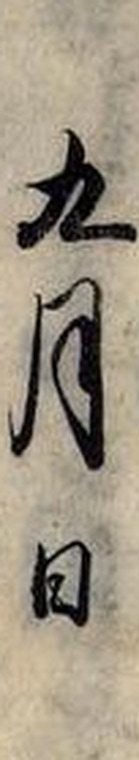九月日
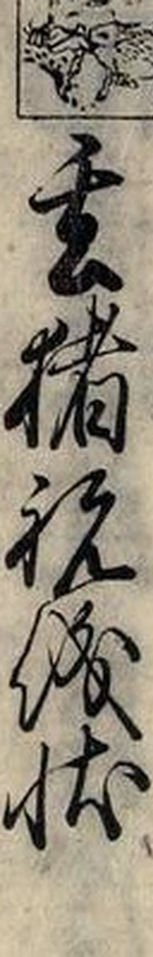玄猪祝儀状
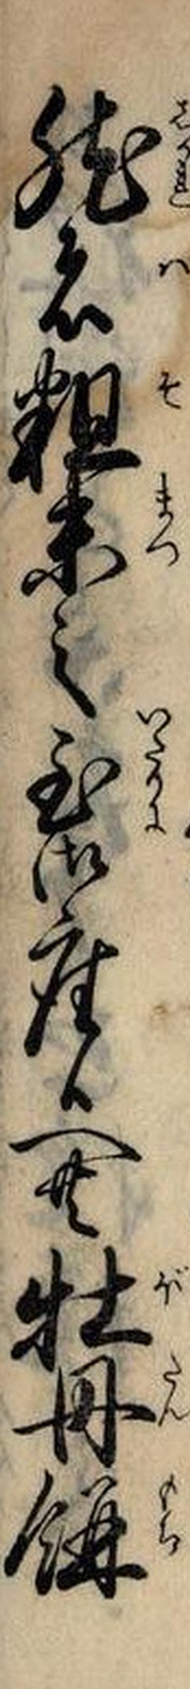然者粗末之至御座候ヘ共牡丹餅
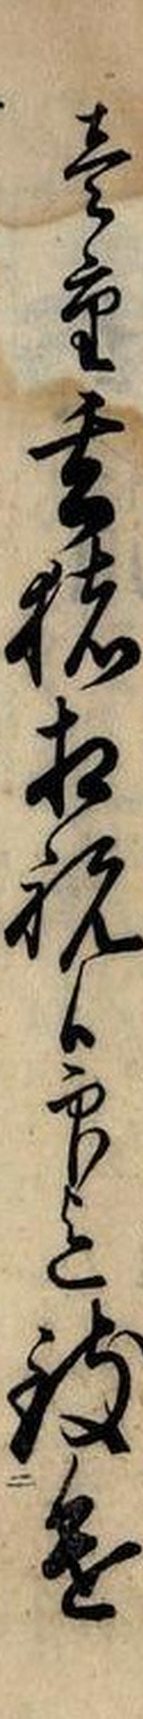壱重玄猪相祝候印迄致進
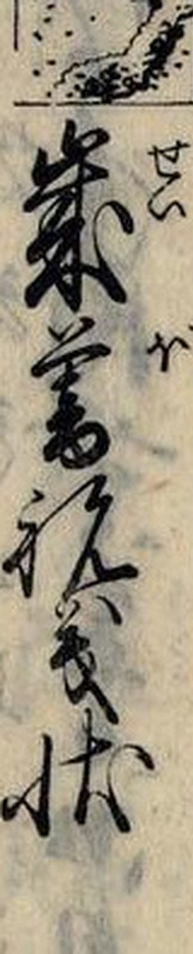歳暮祝義状

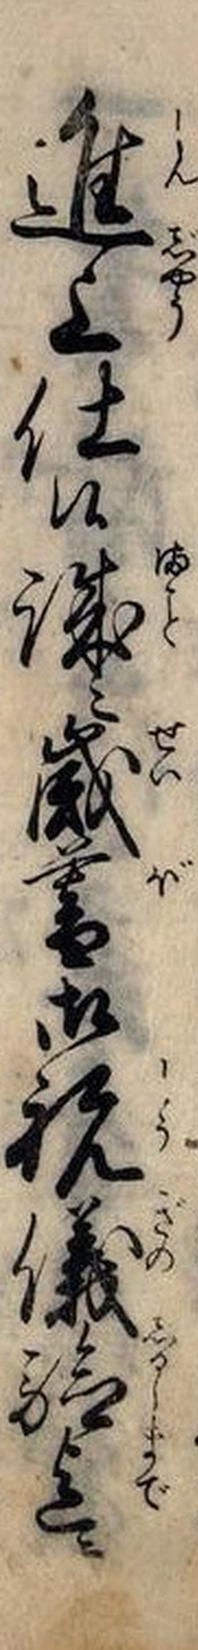進上仕候誠に歳暮御祝儀験迄に
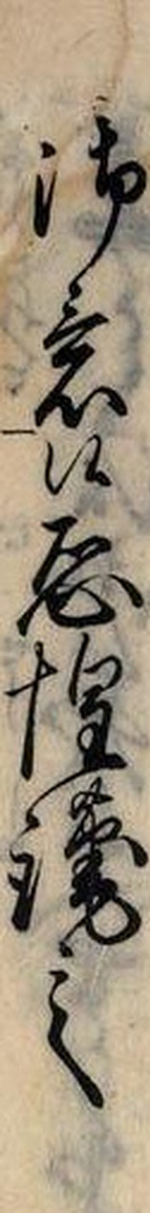御意候恐惶謹言
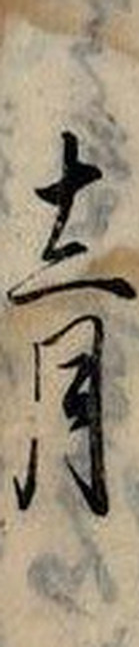十二月
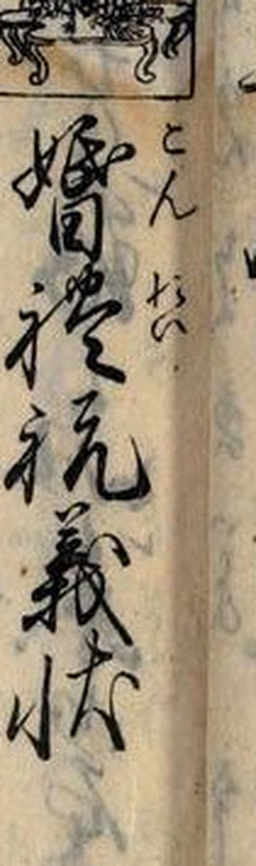婚礼祝義状
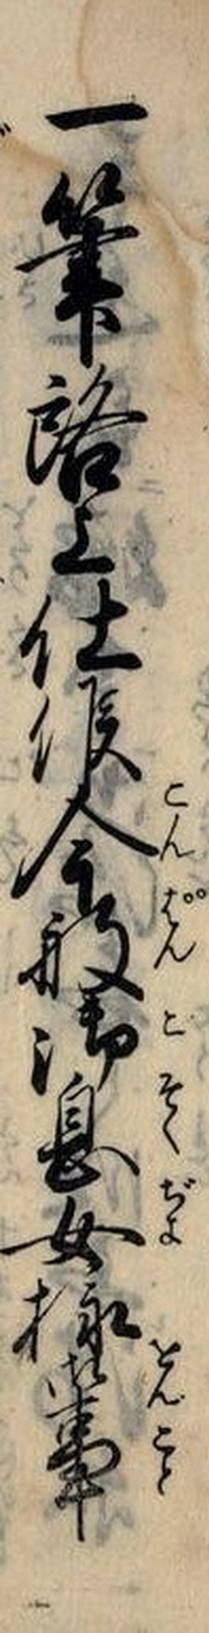一筆啓上仕候今般御息女様御事
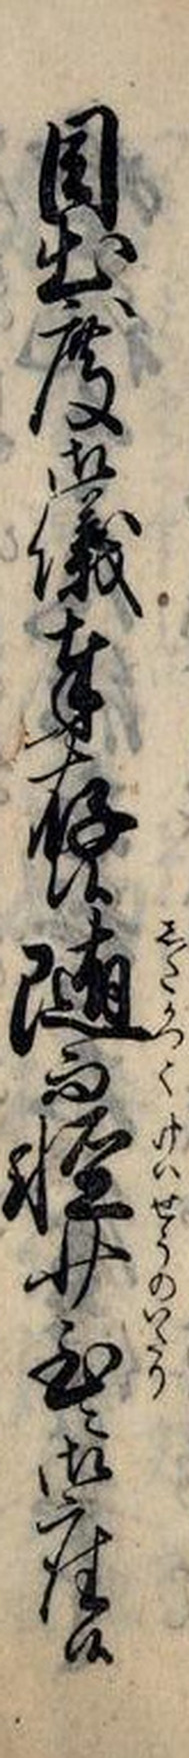目出度御儀奉存候随而軽少至に御座候

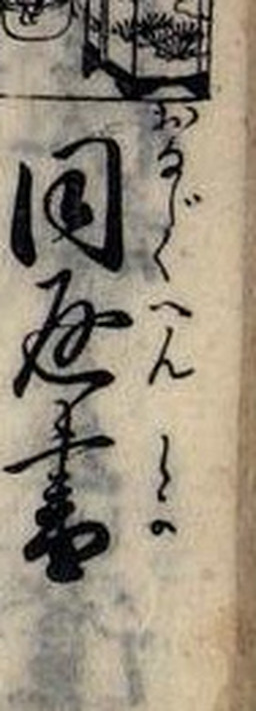同返書
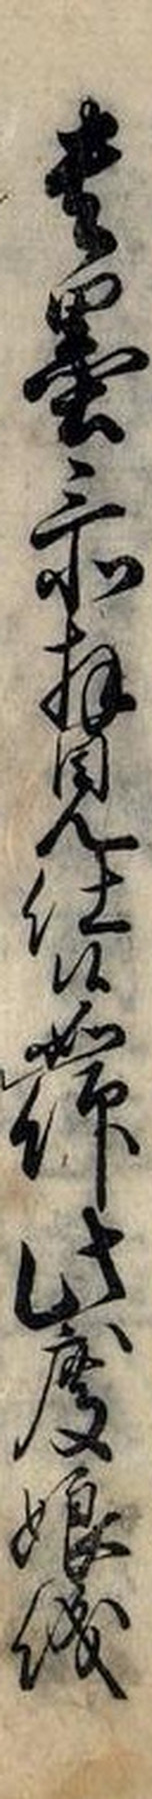貴墨忝拝見仕候如仰此度娘儀
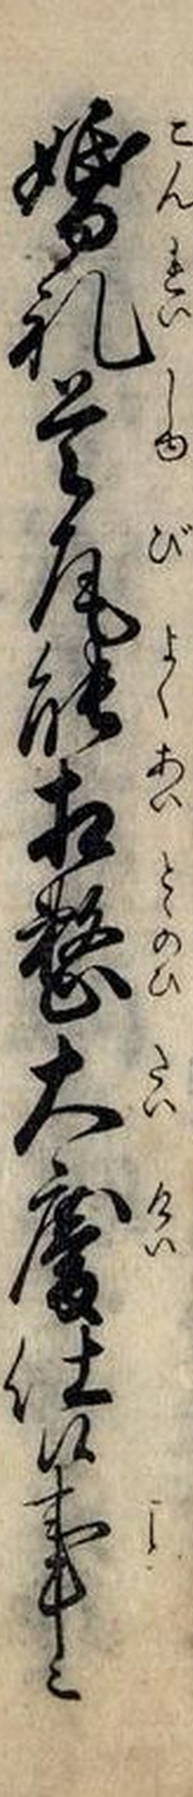婚礼首尾能相整大慶仕候事に
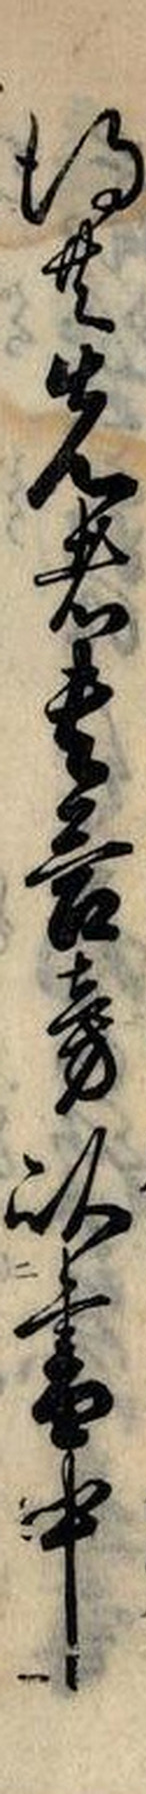得共先者貴答旁以書中
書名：大成用文章（往来物）
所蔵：福井県文書館 Fukui Prefectural Archives
